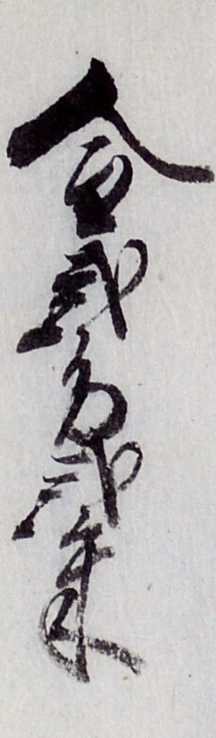金弐分弐朱
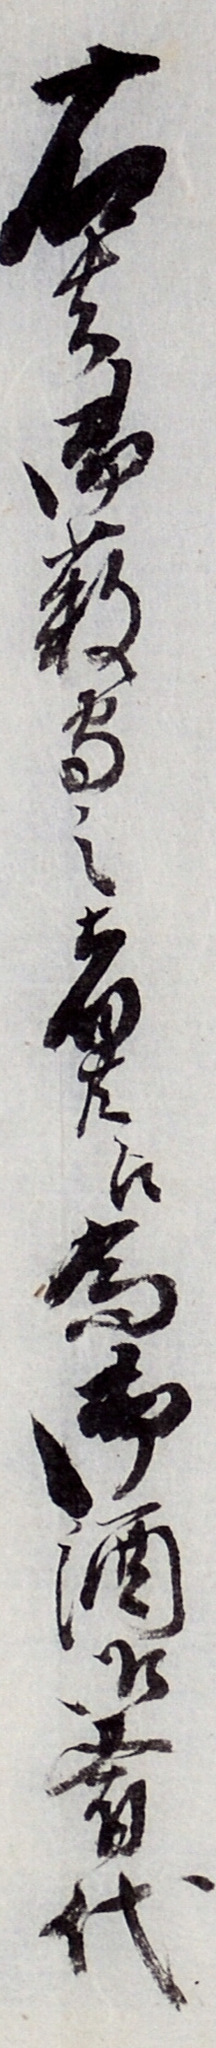右者御薪守之者共江為御酒御肴代
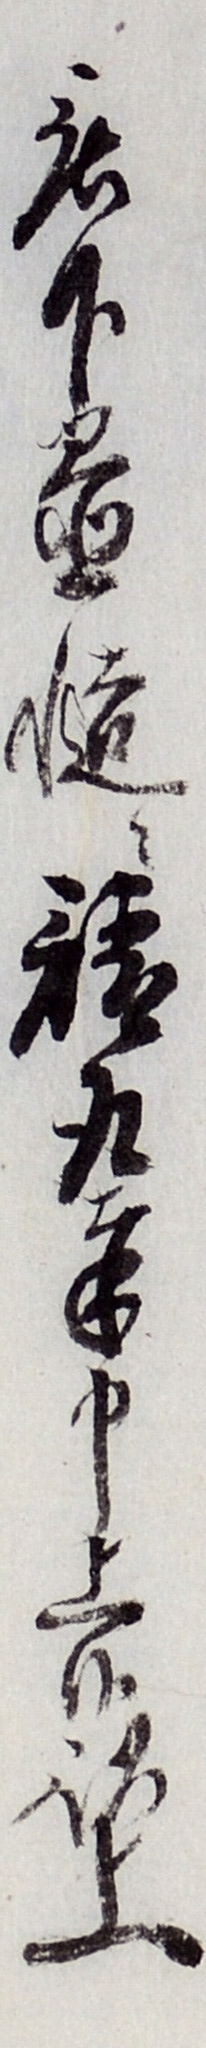被下置慥ニ請取奉申上候以上
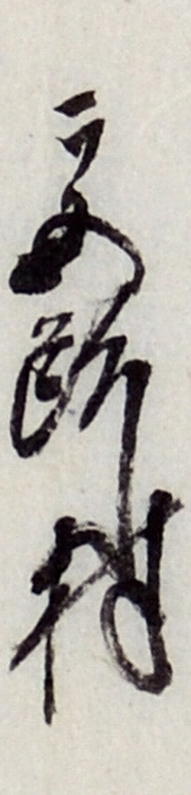宮所村
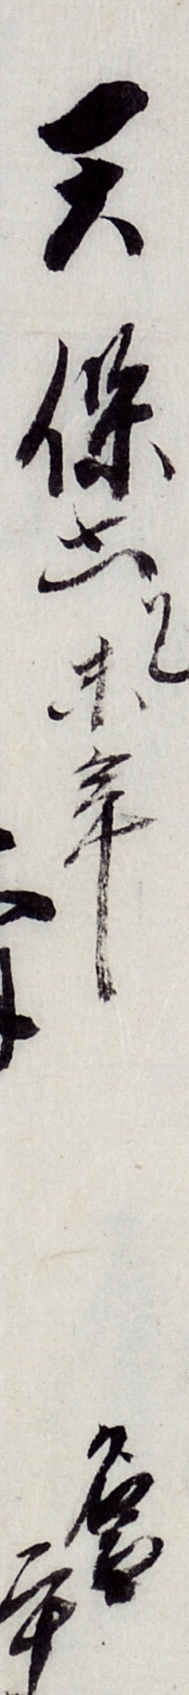天保六乙未年三月
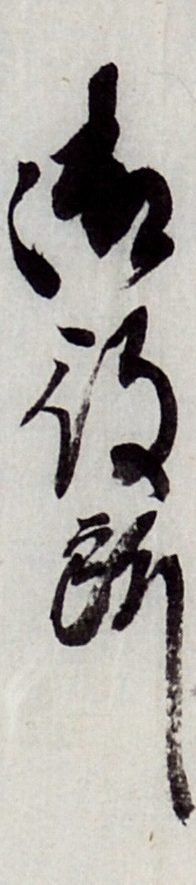御役所

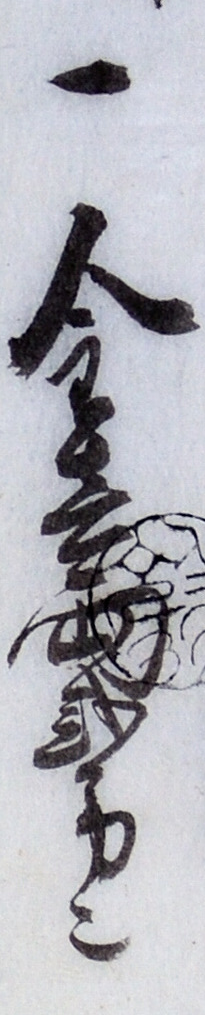一金壱両弐分也
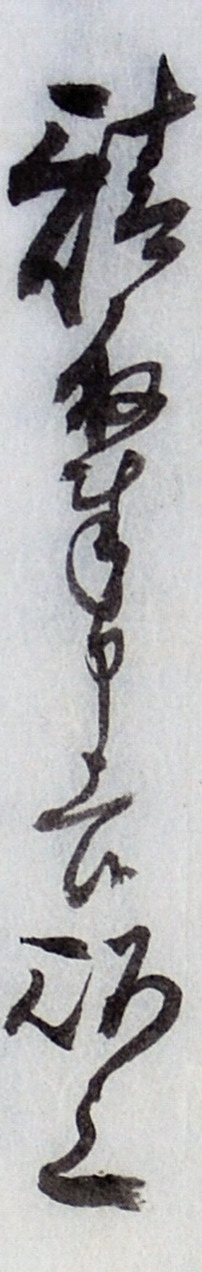請取奉申上候以上
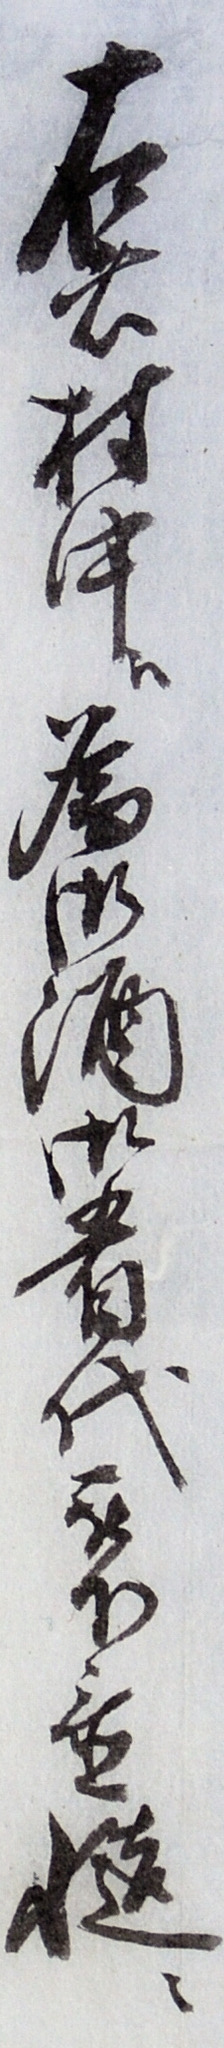右者村中江為御酒御肴代被下置慥ニ
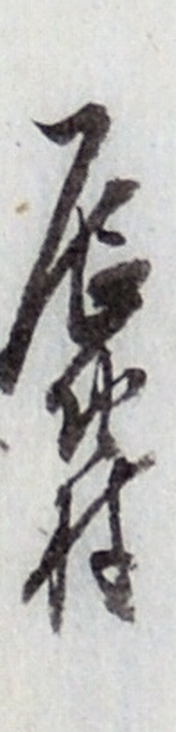辰野村
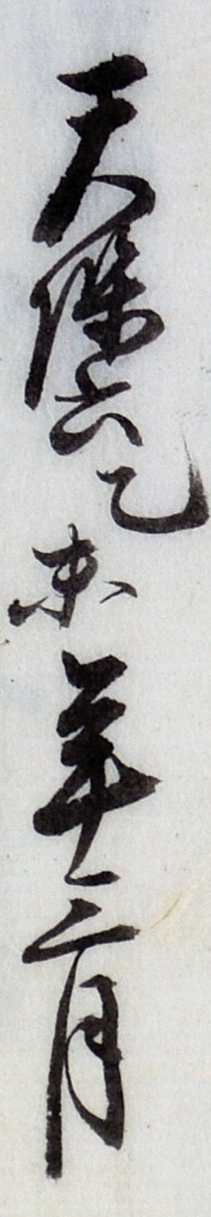天保六乙未年三月
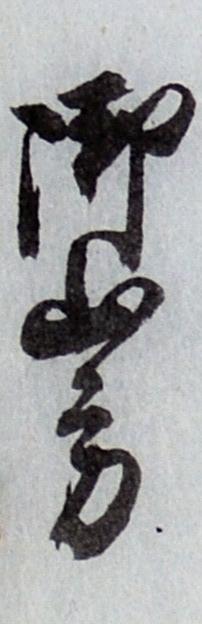御山方
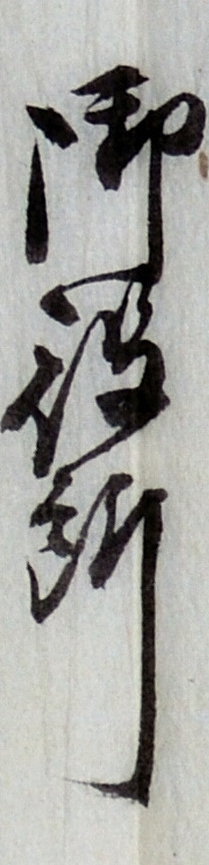御役所
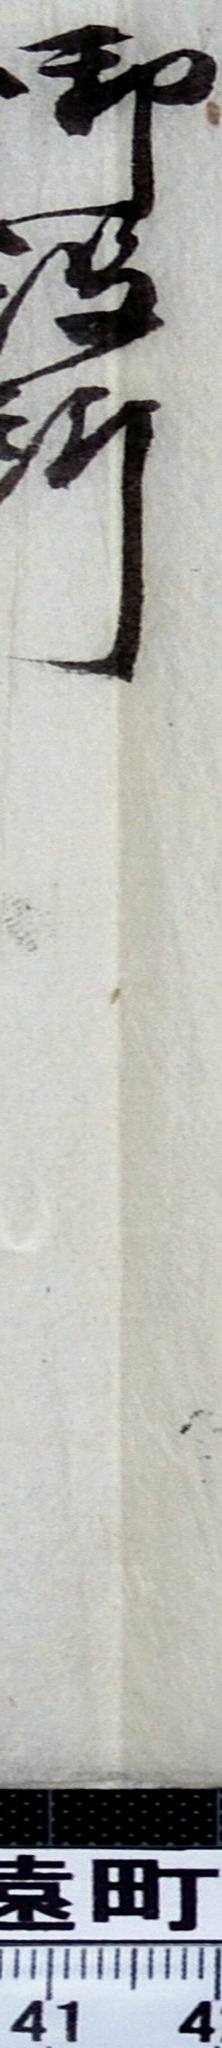御役所

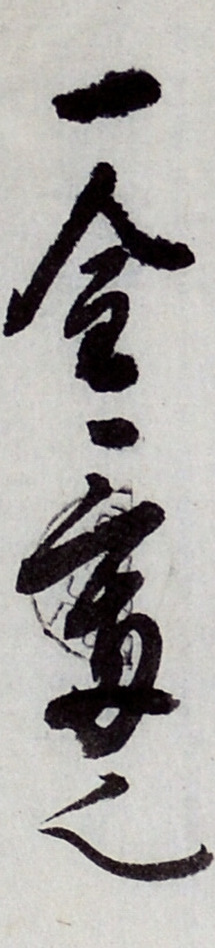一金三両也
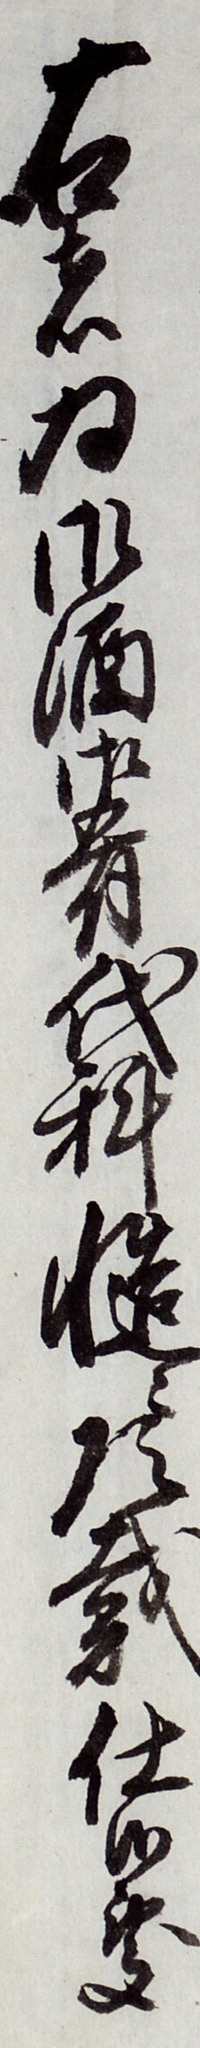右者為御酒御肴代科慥ニ頂戴仕候処
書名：覚
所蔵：伊那市立高遠町図書館・合同会社AMANE
